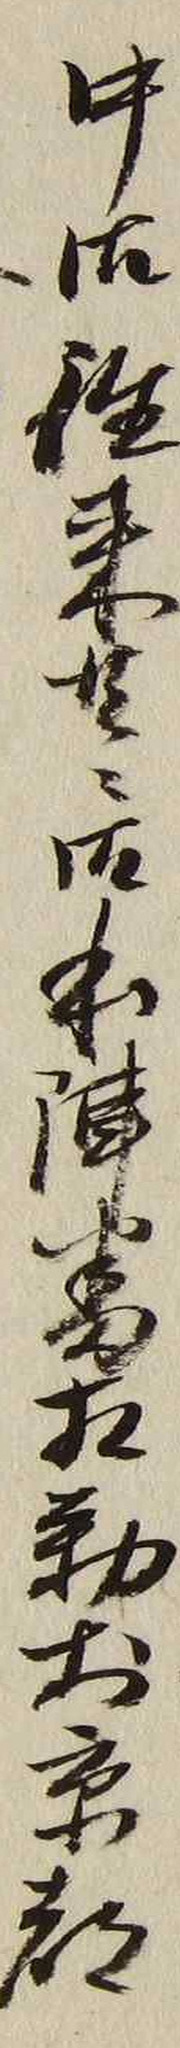中御往来共々御本陣番相勤於京都
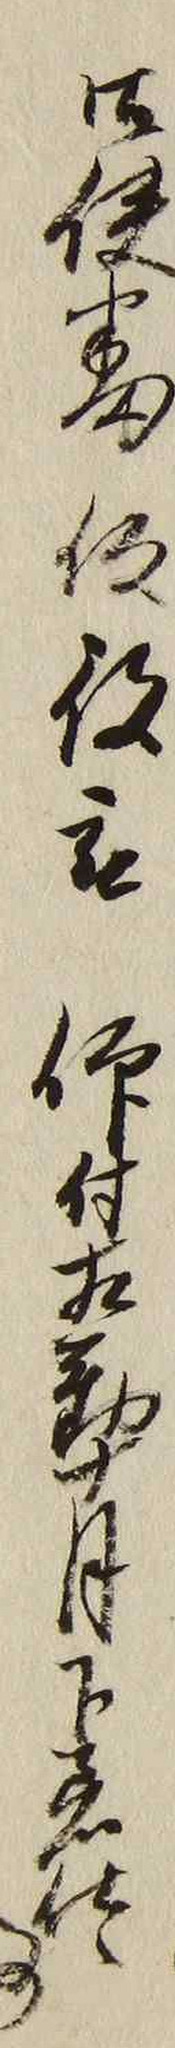御使番仮役被仰付相勤十月下着仕候事

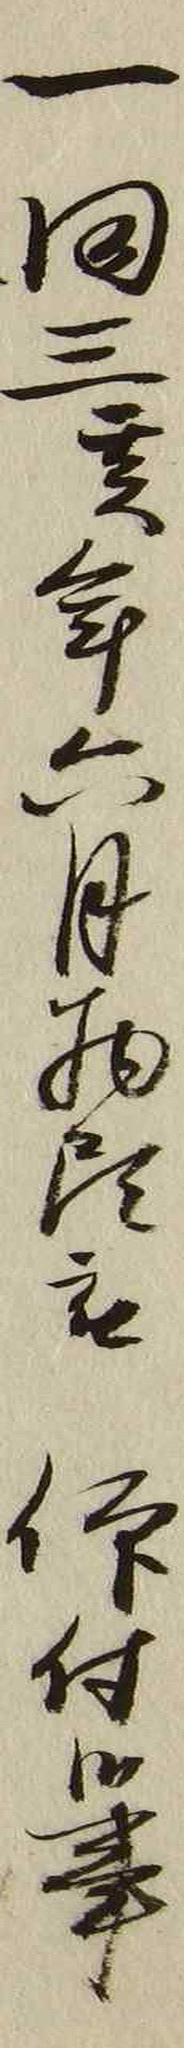一同三亥年六月物頭被仰付候事
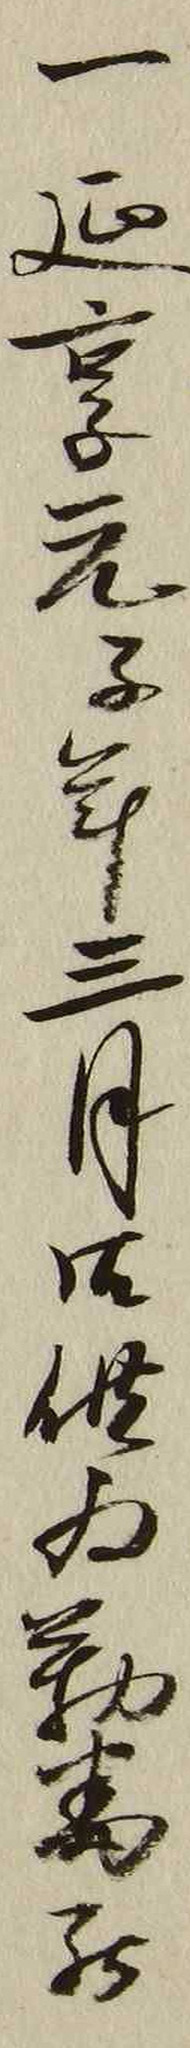一延享元子年三月御供為勤番罷
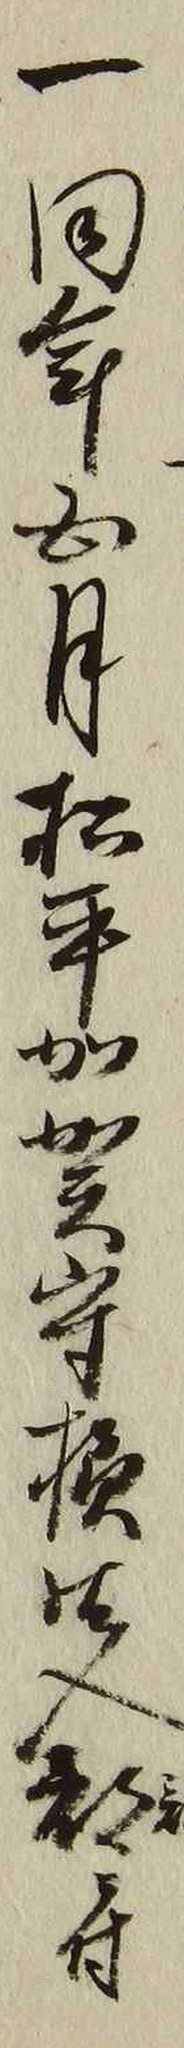一同年五月松平加賀守様御入都ニ付
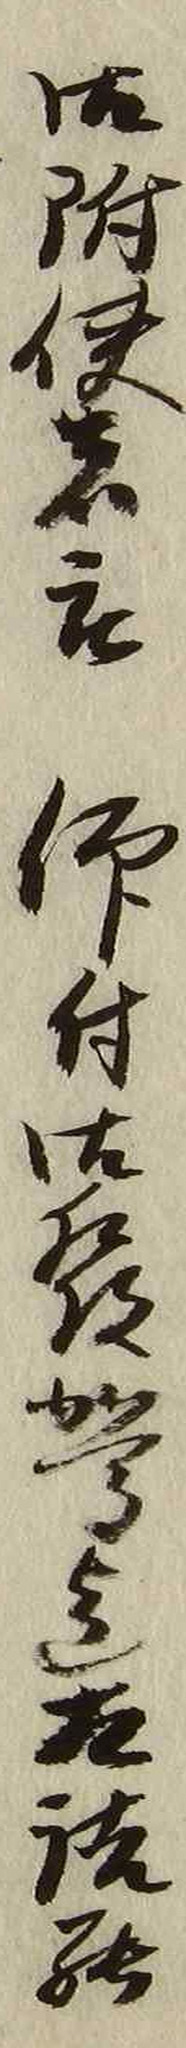御附使者被仰付御発駕迄相詰罷
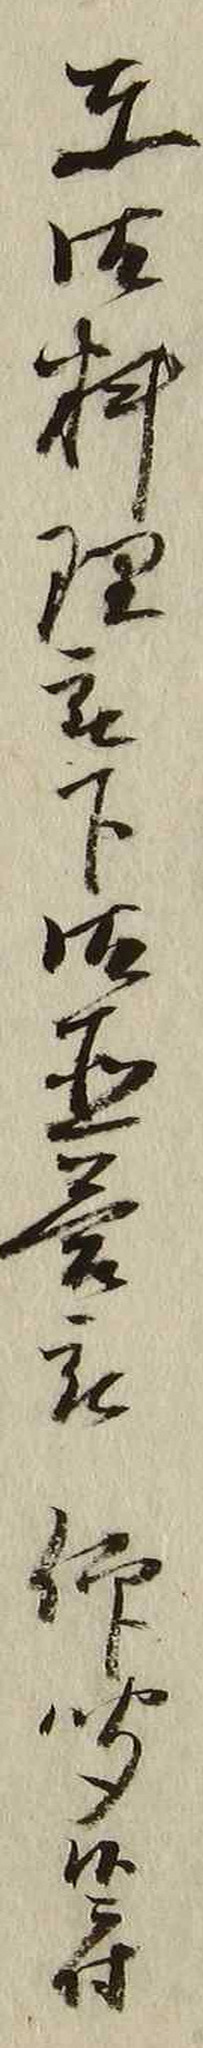在御料理被下御直答被仰聞候ニ付
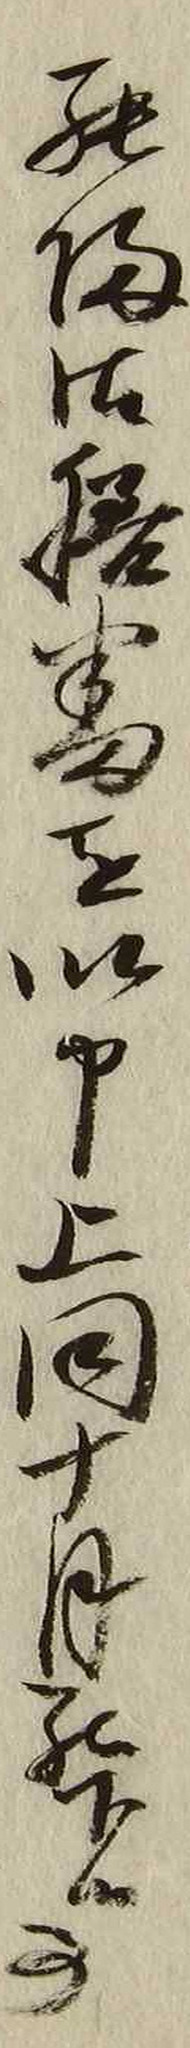罷帰御膳番を以申上同十月罷下候事
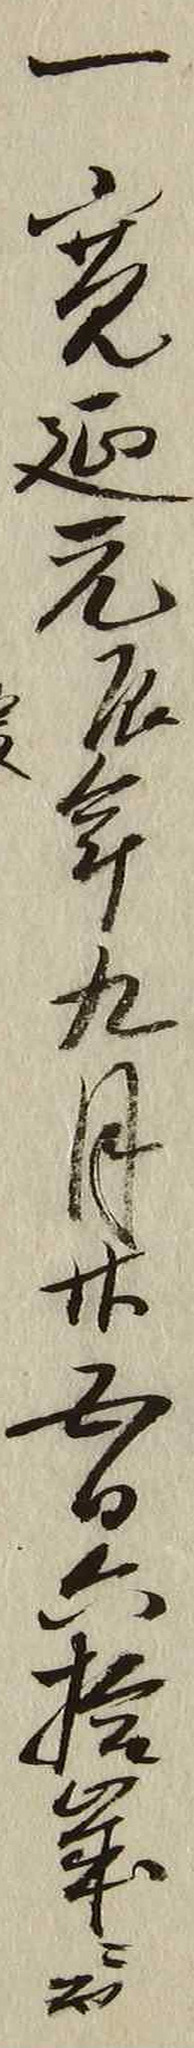一寛延元辰年九月廿五日六拾歳ニ而
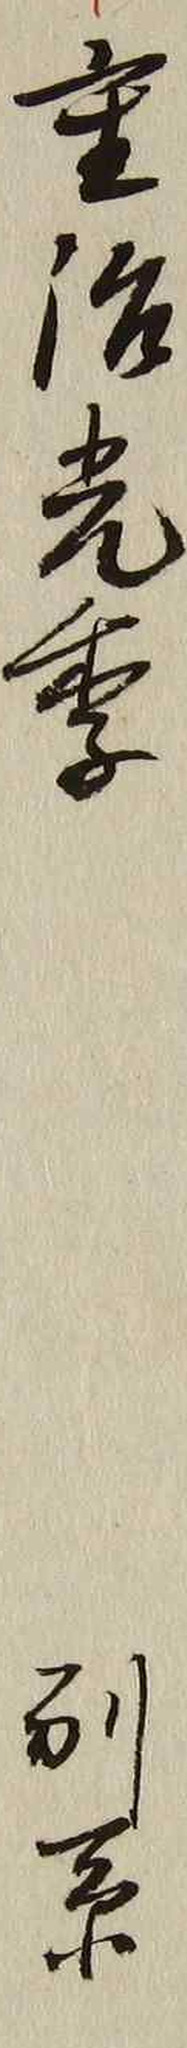重治光季別系
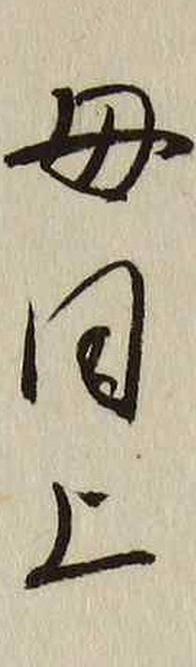母同上
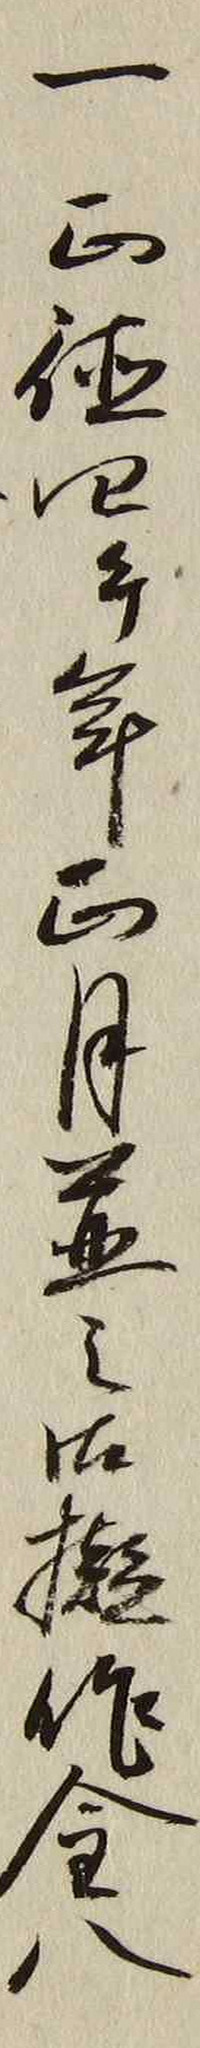一正徳四午年正月並之御擬作金八
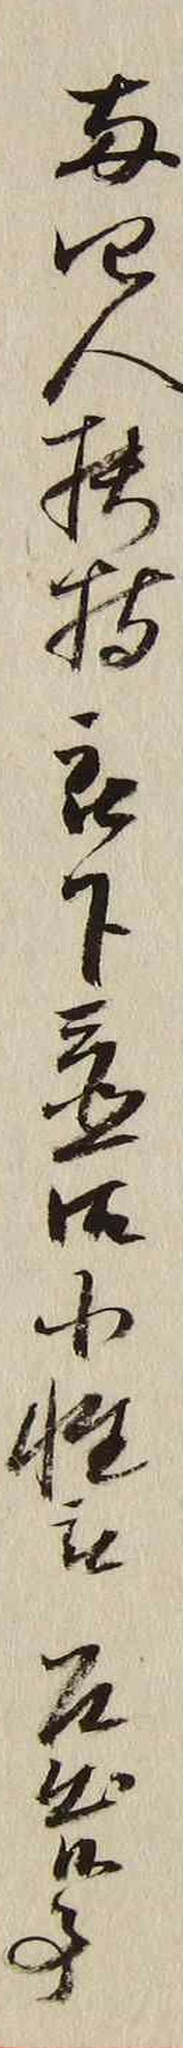両四人扶持被下置御小性被召出候事

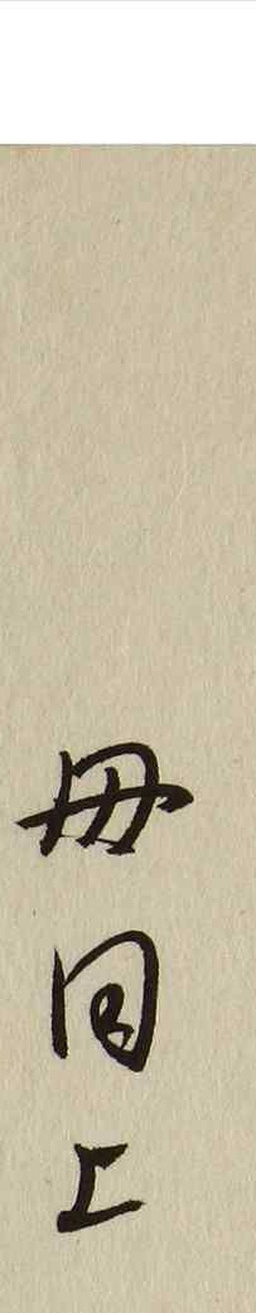母同上
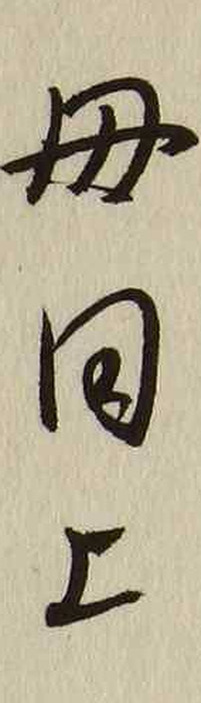母同上
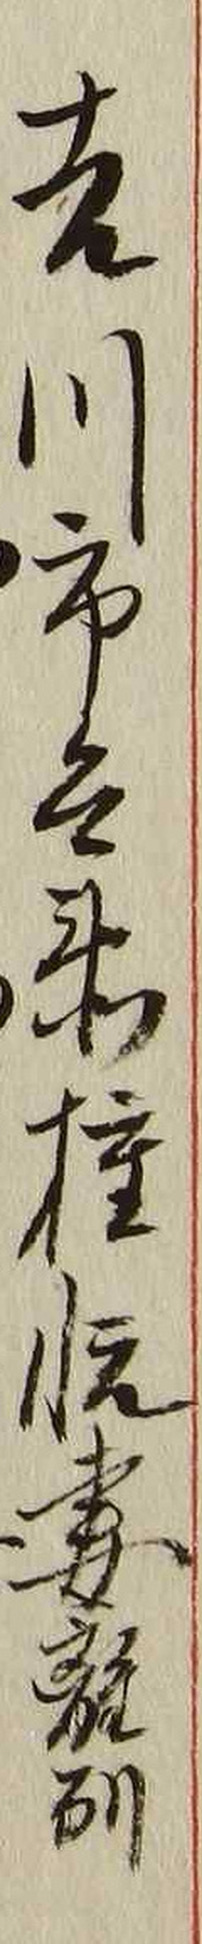女吉川市兵衛権悦妻離別
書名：諸士系譜　巻之356　す之部6
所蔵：会津若松市立会津図書館
